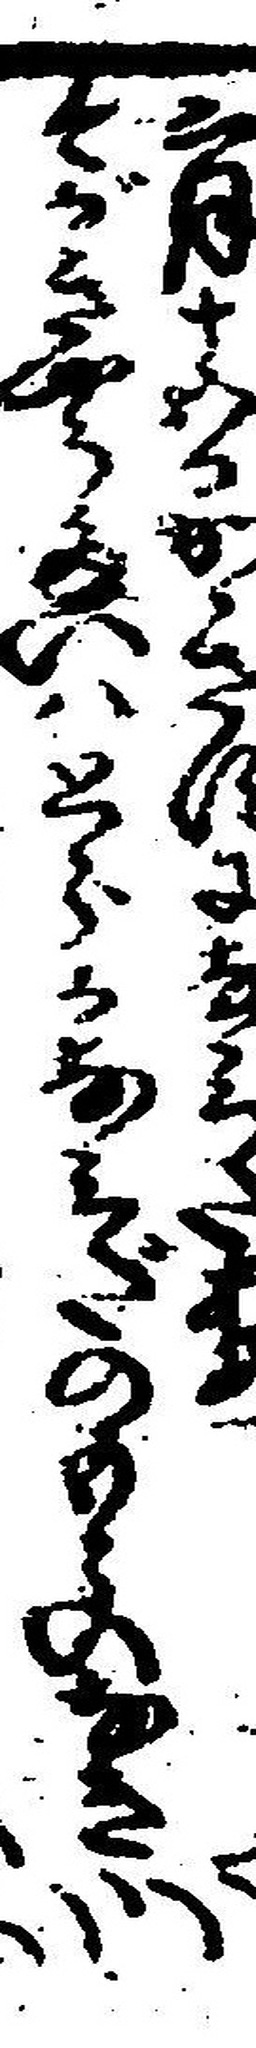そがきやうたいはとらかなみだのもらいなき
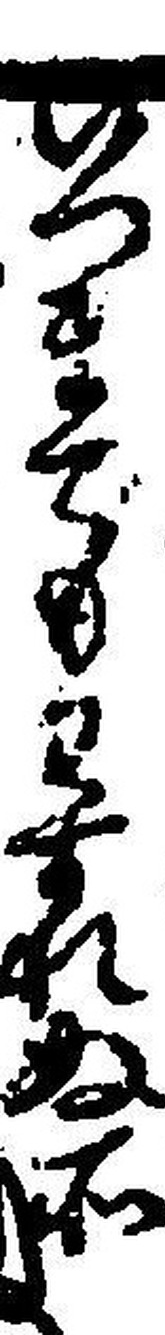いつまでもわすれぬ所
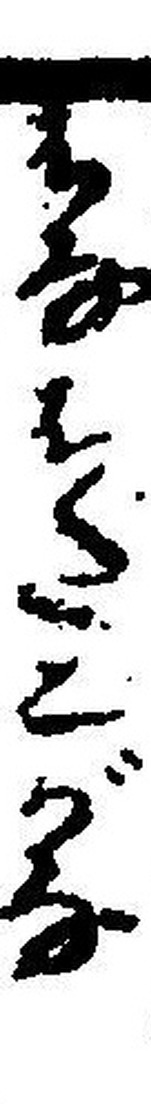はなはだこ？がな
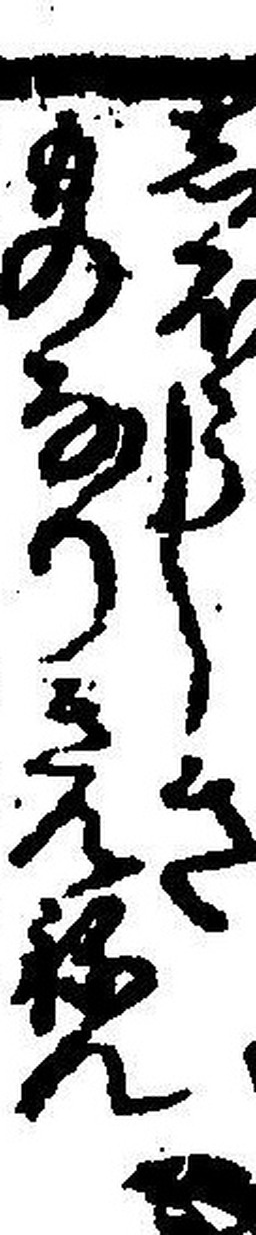ものなりきんねん
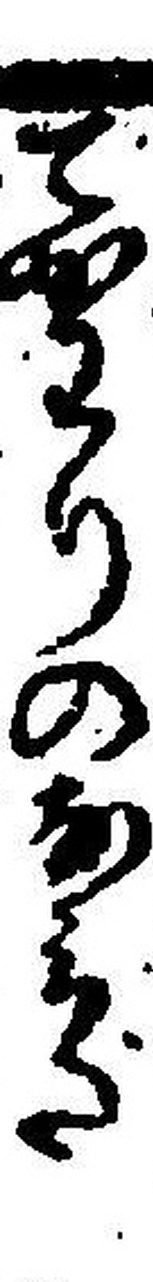てかわりのなみた
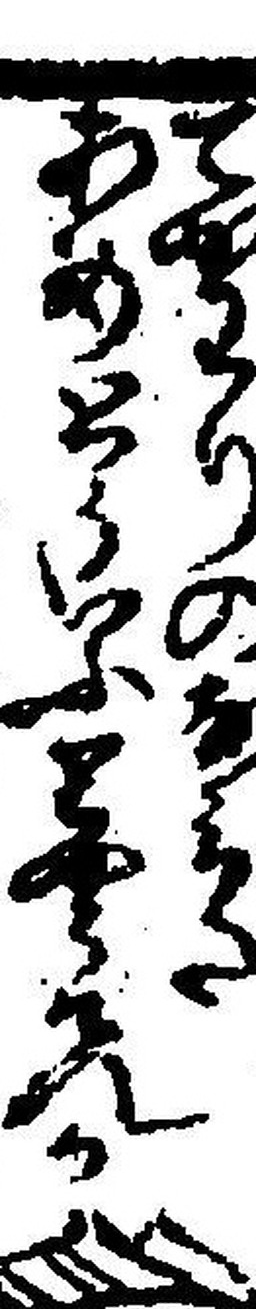あめとういふりやうけんか
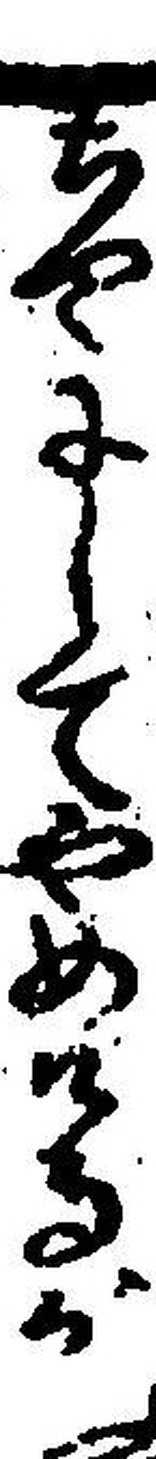ちやにしてやめけるが
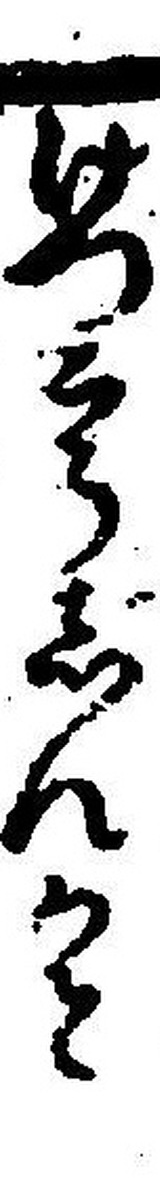けつこうじんかと
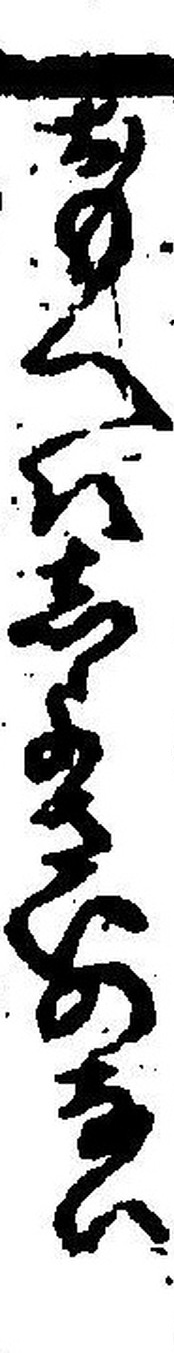おもへはしよさいのない
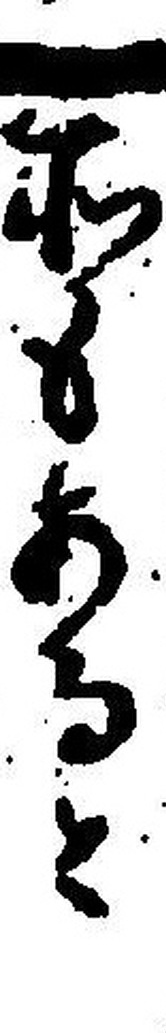所もあると
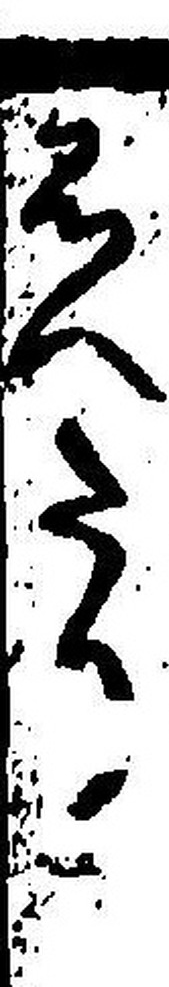見へたり

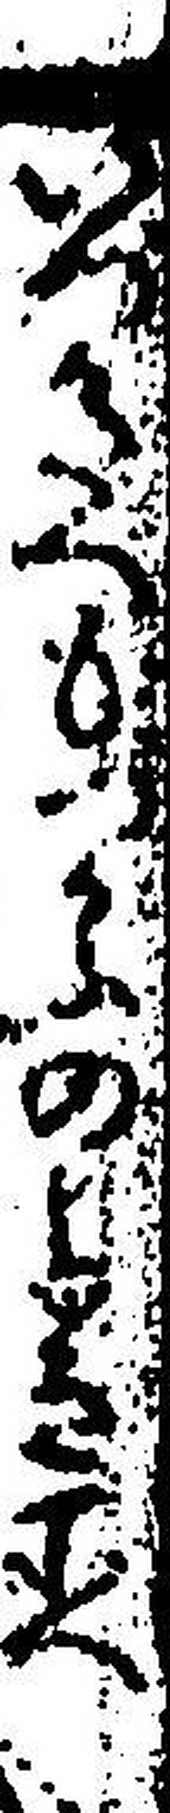いづかたへもつかうのよき所へ
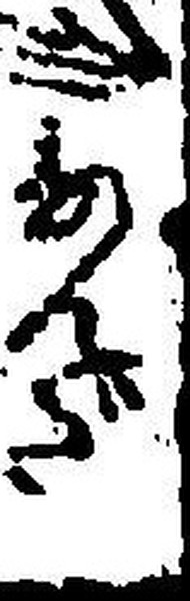なんだ
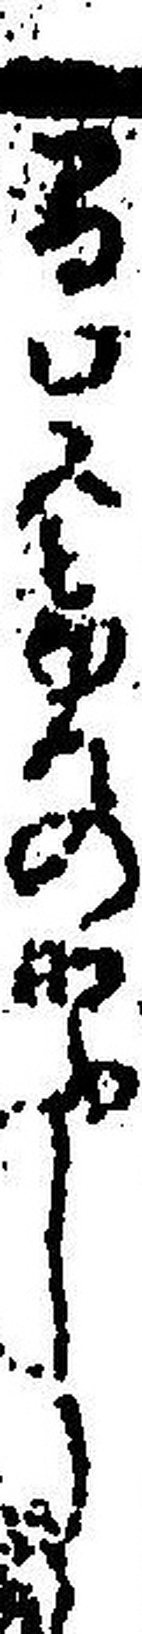間口五けんのかふし
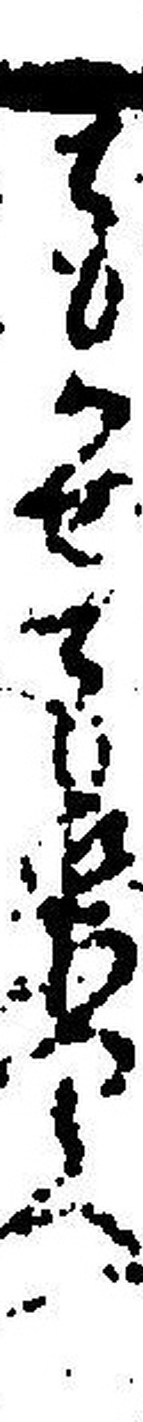てもかせても御あつらへ
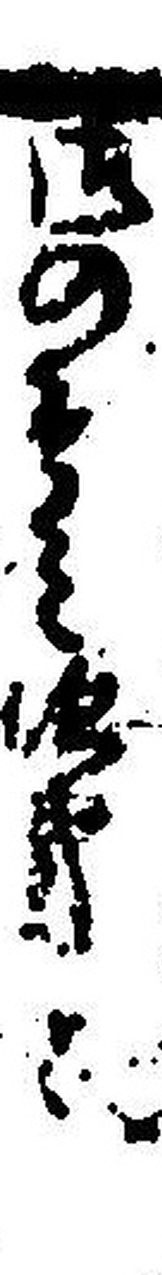御のそみ次第と
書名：天竺儲之筋 / 市場通笑作
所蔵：東京大学総合図書館 General Library in the University of Tokyo, JAPAN
